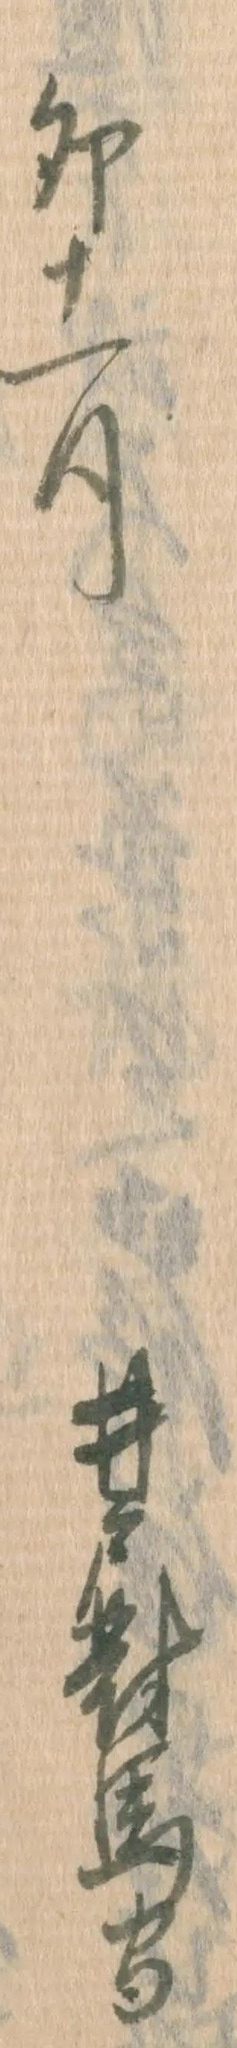卯十一月井戸対馬守
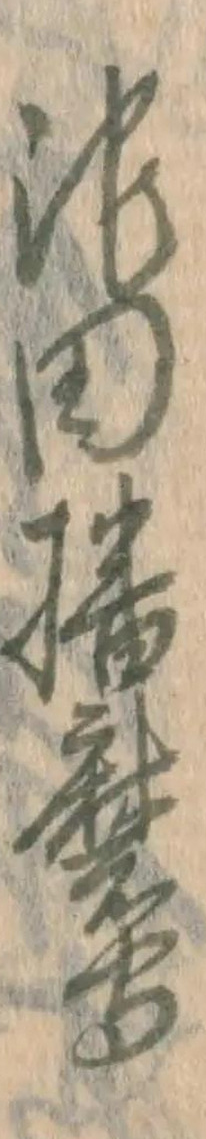池田播磨守
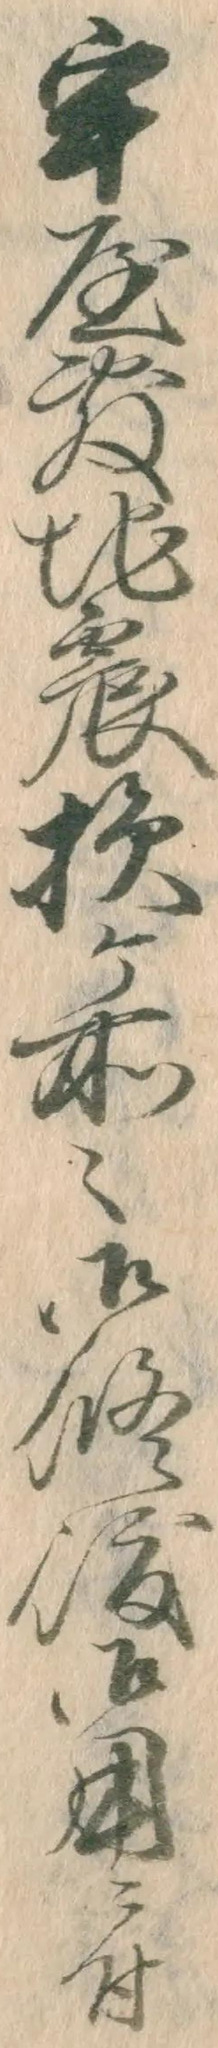牢屋敷地震損ケ処之御修復御用ニ付
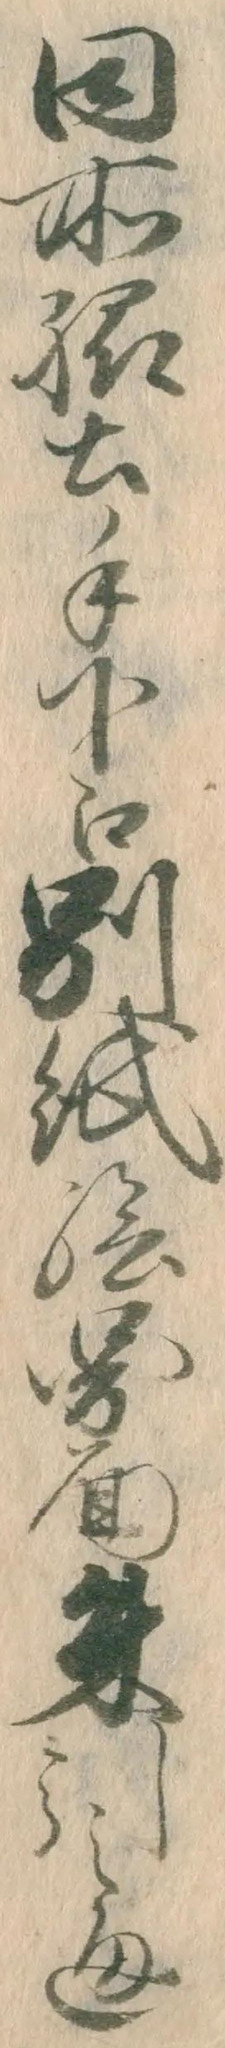同所脇土手下え別紙絵図面朱引之通

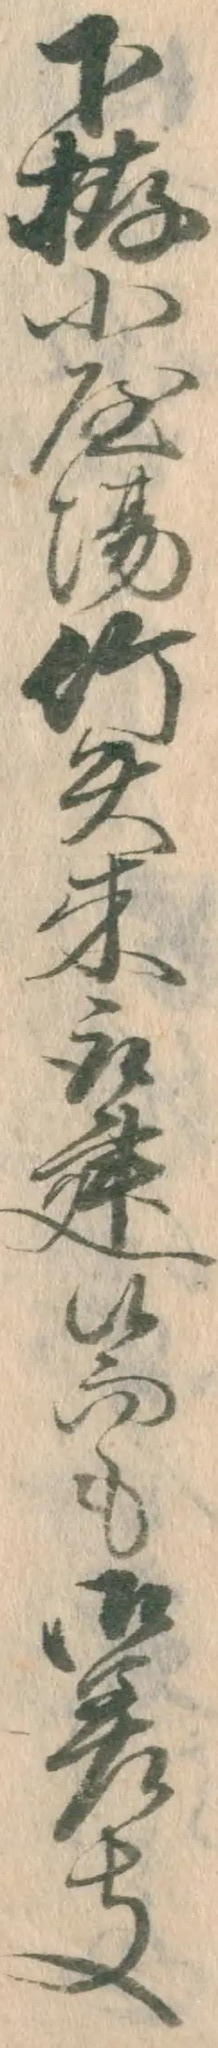下拵小屋場竹矢来取建候ても御差支
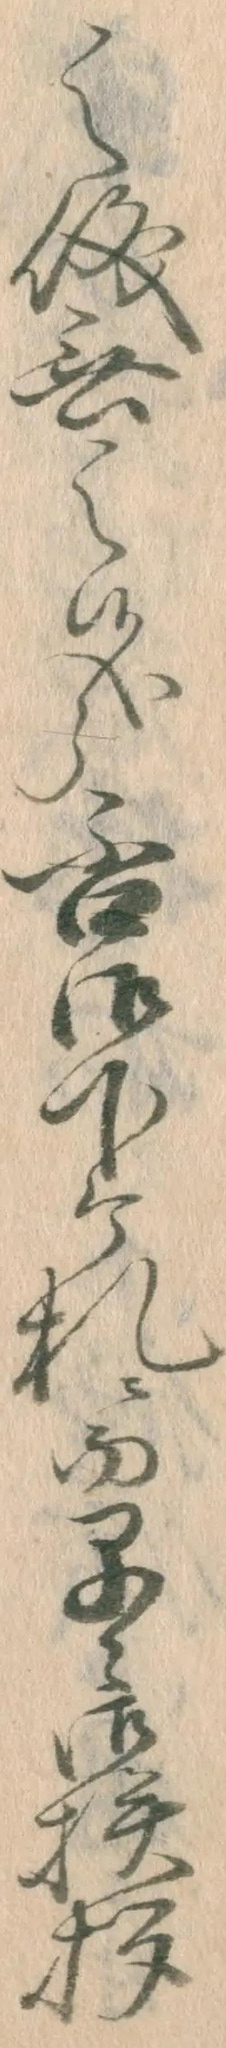之儀無之候哉否御下ケ札ニて早〻御挨拶
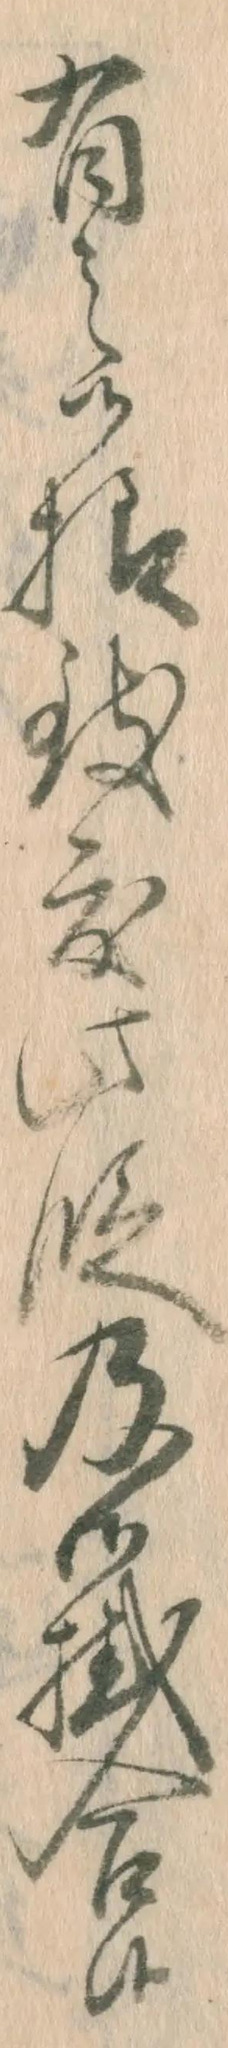有之候様致度此段及御掛合候
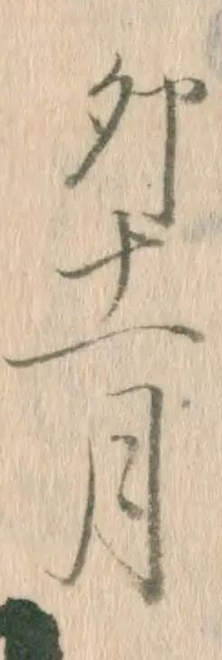卯十一月
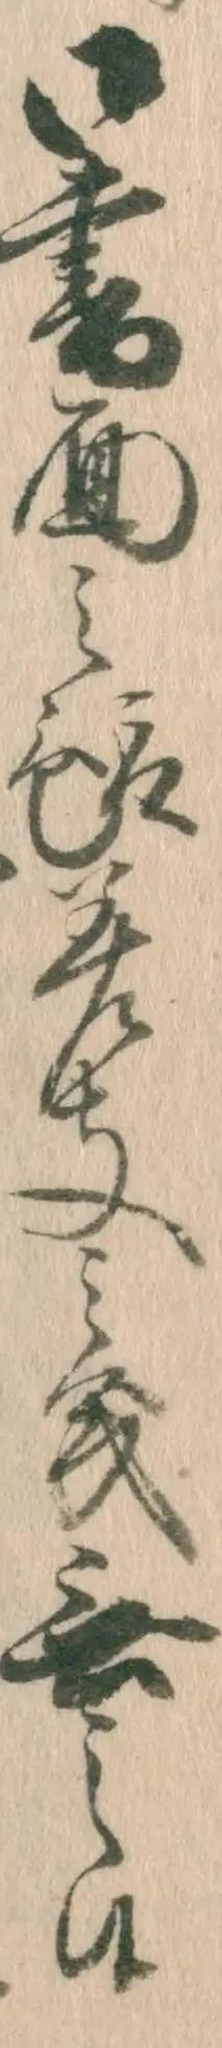御書面之趣差支之義無之候
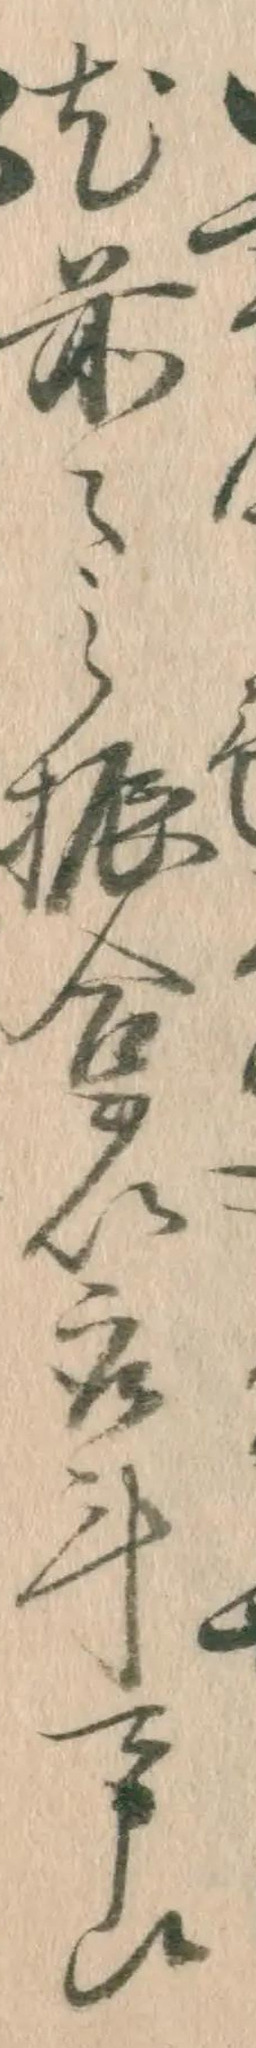尤前〻之振合ヲ以取計可申候
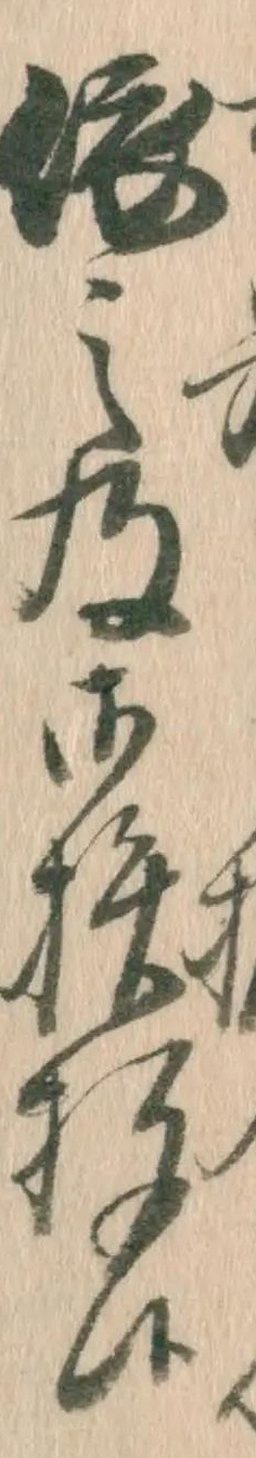依之及御挨拶候
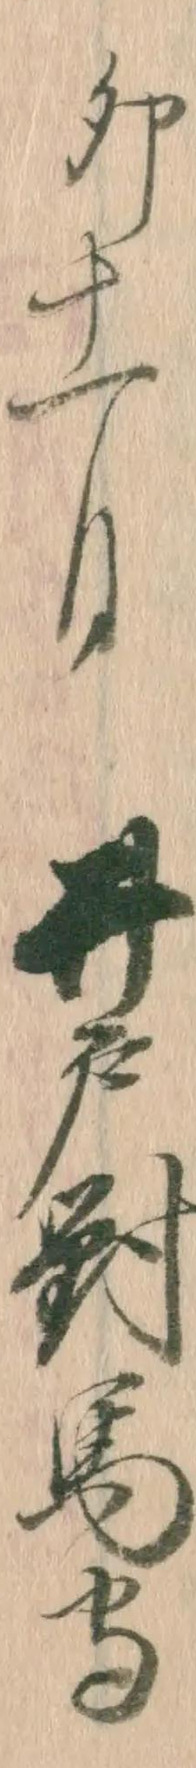卯十一月井戸対馬守
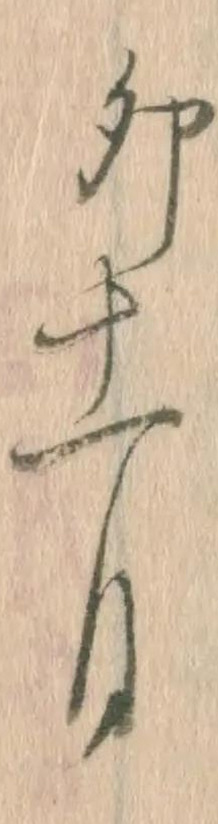卯十一月

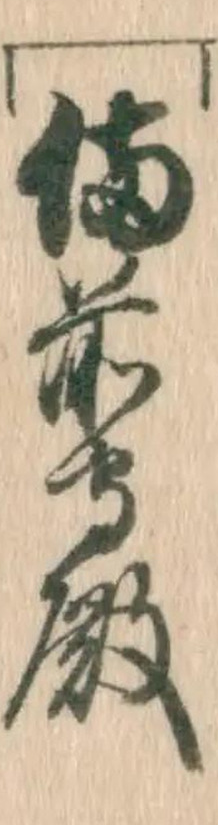│[備前守殿
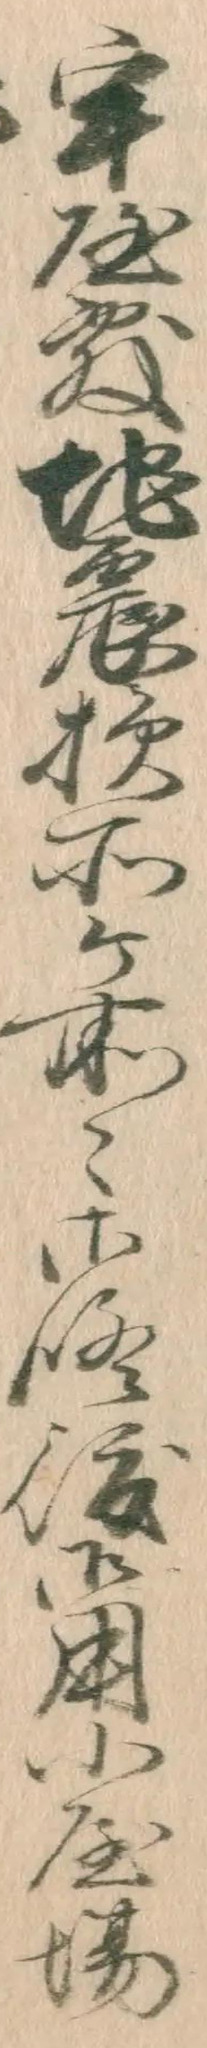│牢屋敷地震損所ケ所〻御修復御用小屋場
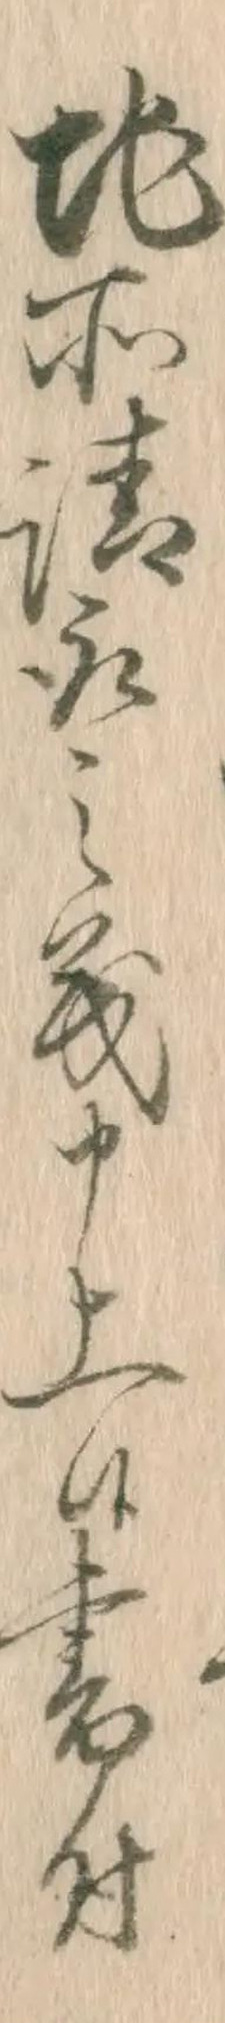│地所請取之義申上候書付
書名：七十冊物類集 71巻. [44] 四十三 牢屋敷御普請御修覆地震ニ付骨折候牢屋掛御褒美之部
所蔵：国立国会図書館 National Diet Library, JAPAN
